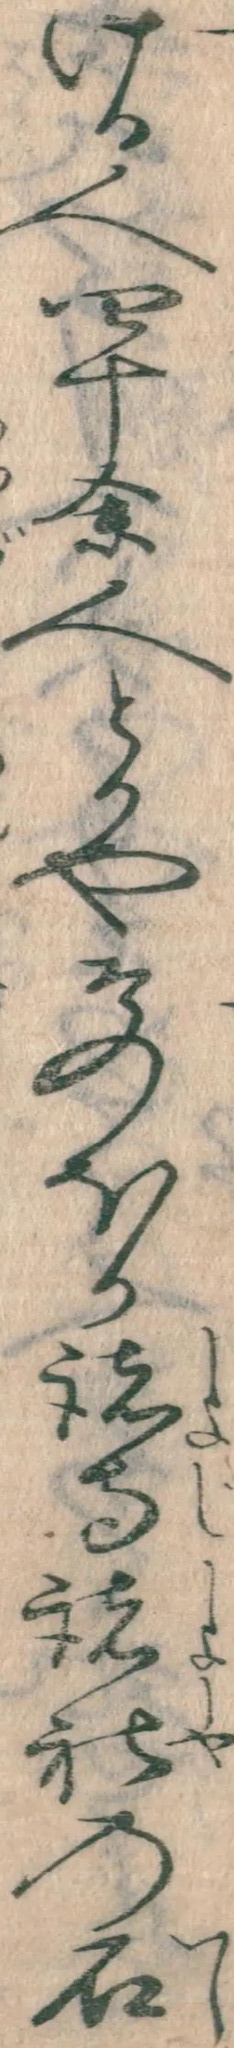ける人四十余人とかやそのほか諸寺諸社の石
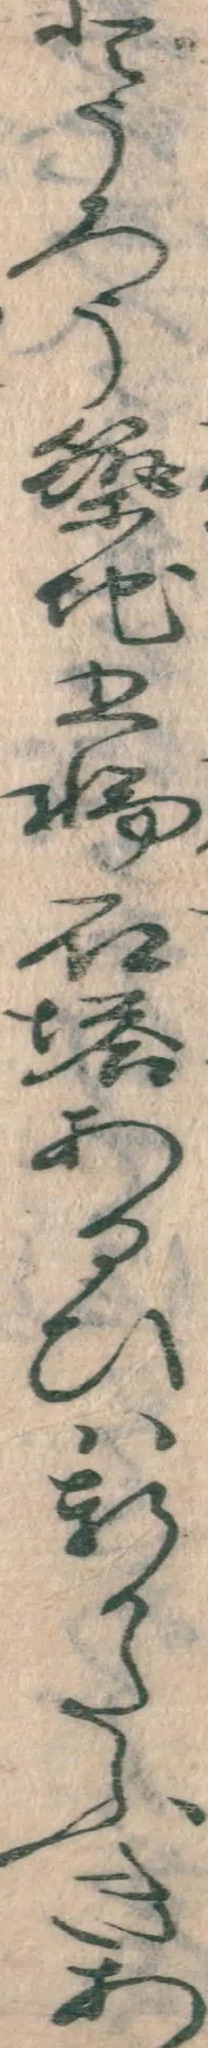どうろう築地五輪石塔あるひは軒かたふきあ
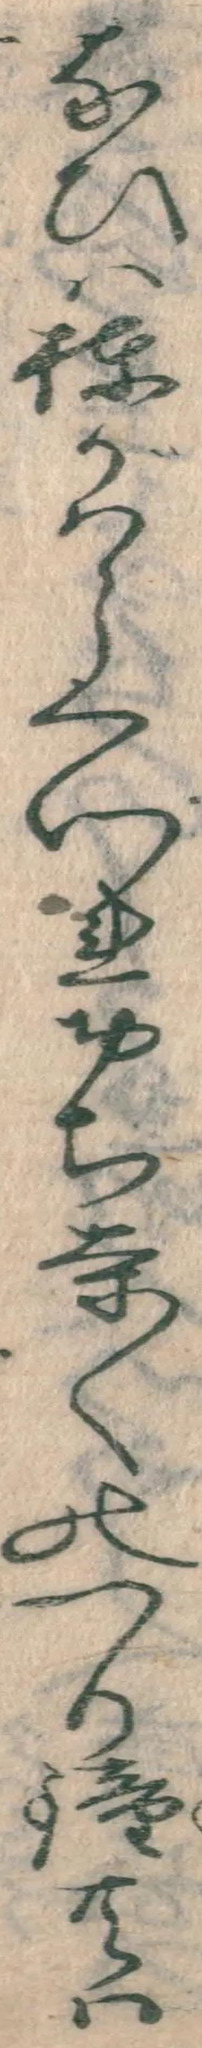るひは棟がはらくづれおち寺〳〵のつり鐘共は
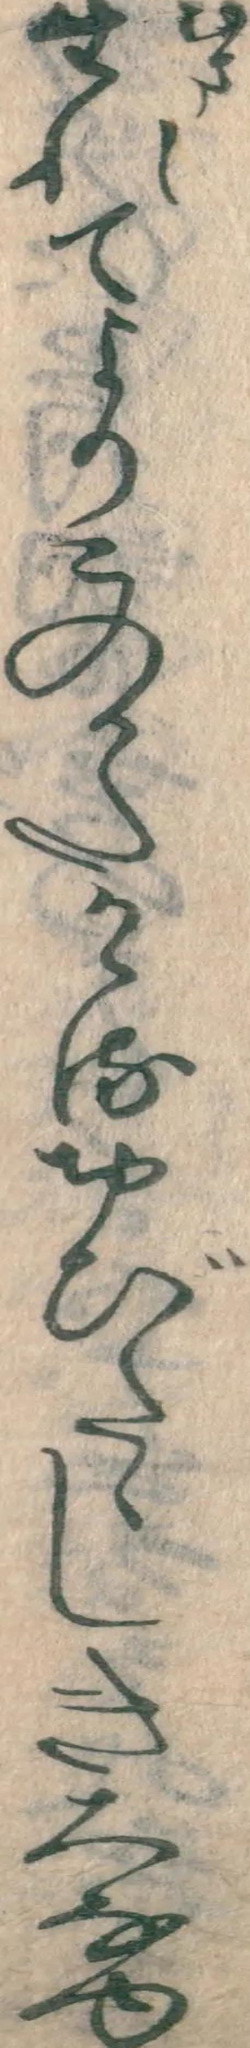生れてよりこのかたかゝるおびたゝしき大なゆ
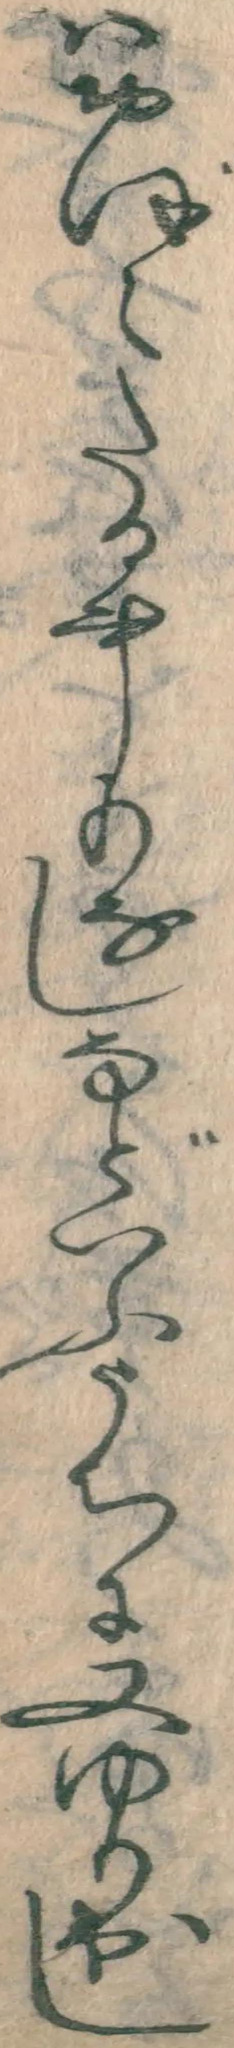はおぼしたる事もなしなどいふうちに又ゆり出し

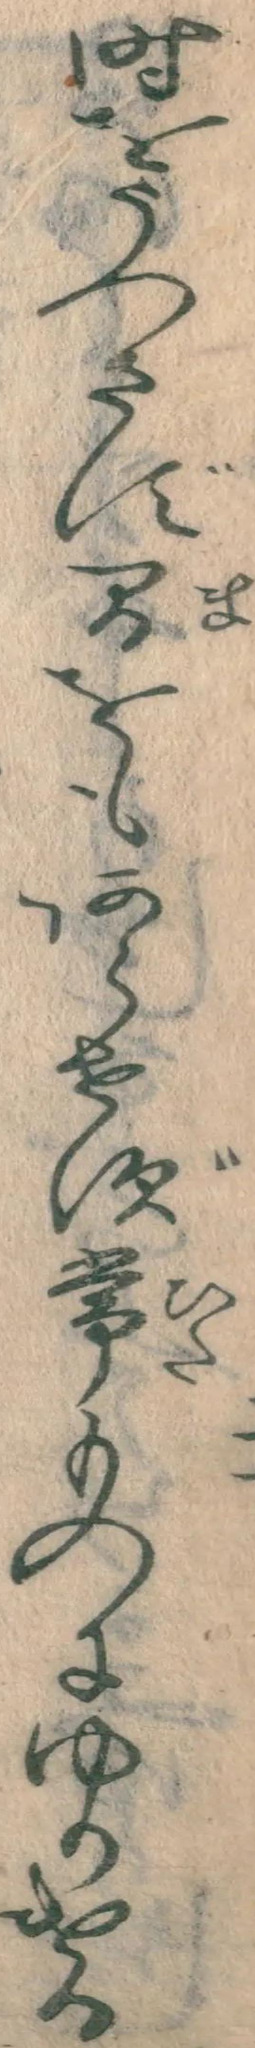時をうつさず間をもあらせず常ものにゆりける
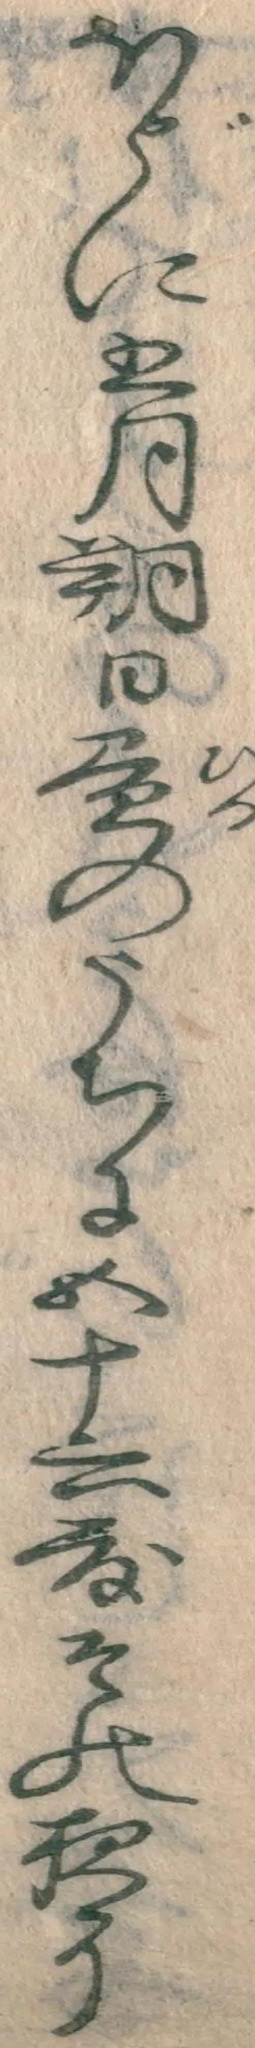ほどに五月朔日昼のうちに五十六度その夜に
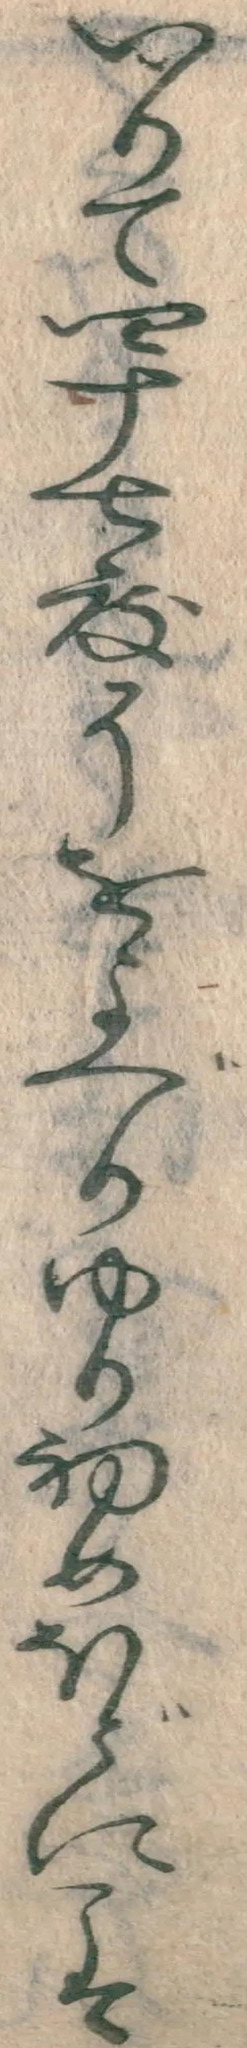いりて四十七度にをよへりゆり初めほどにこそ
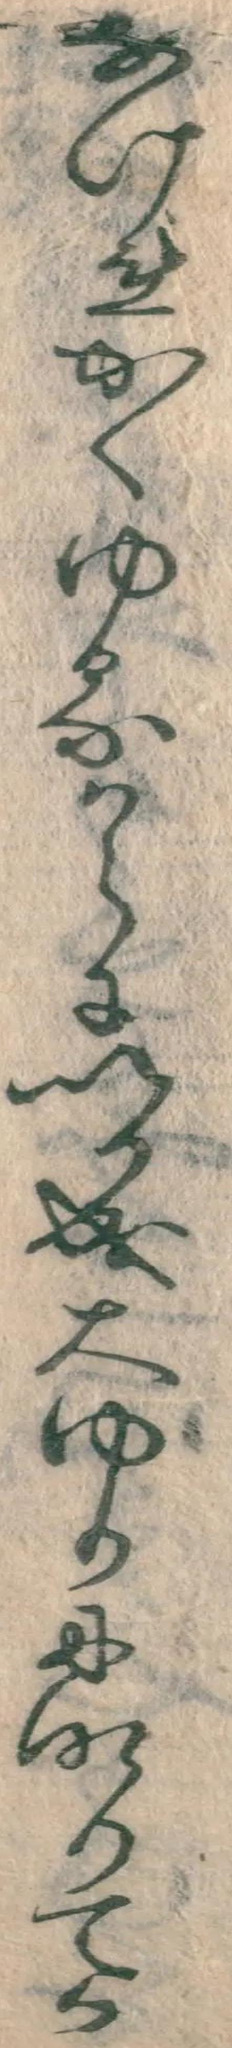なけれかくゆるからにいか成大ゆりになりてか
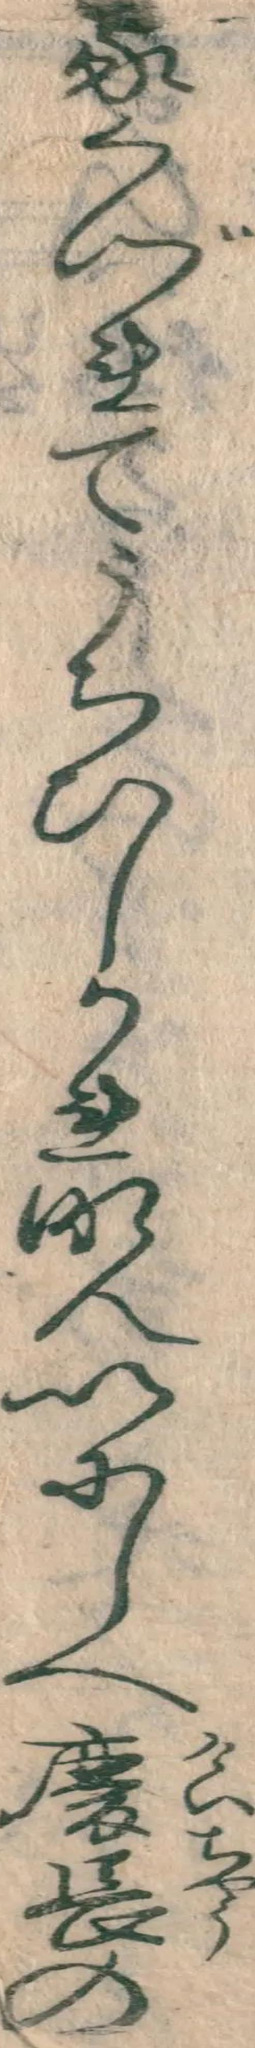家くづれてうちひしかれなんいにしへ慶長の
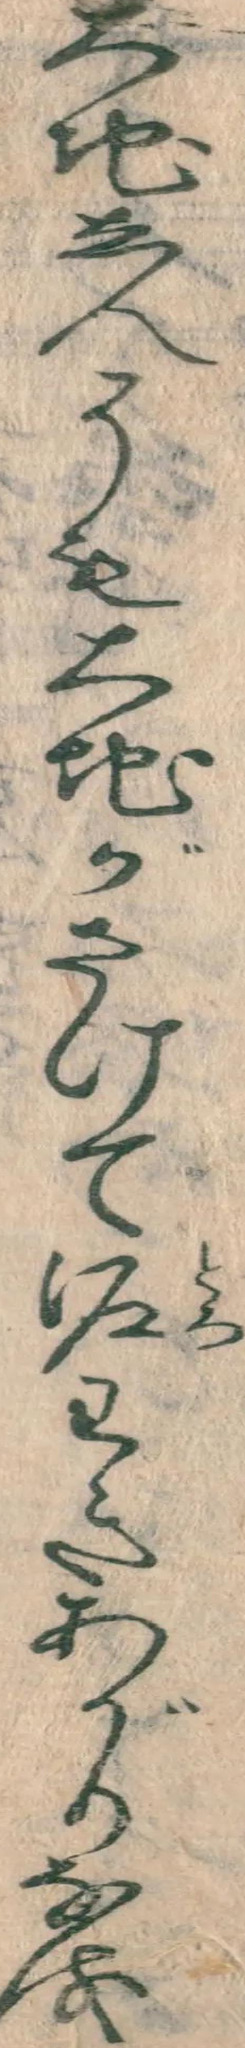大地しんそも大地がさけて泥わきあがりなを
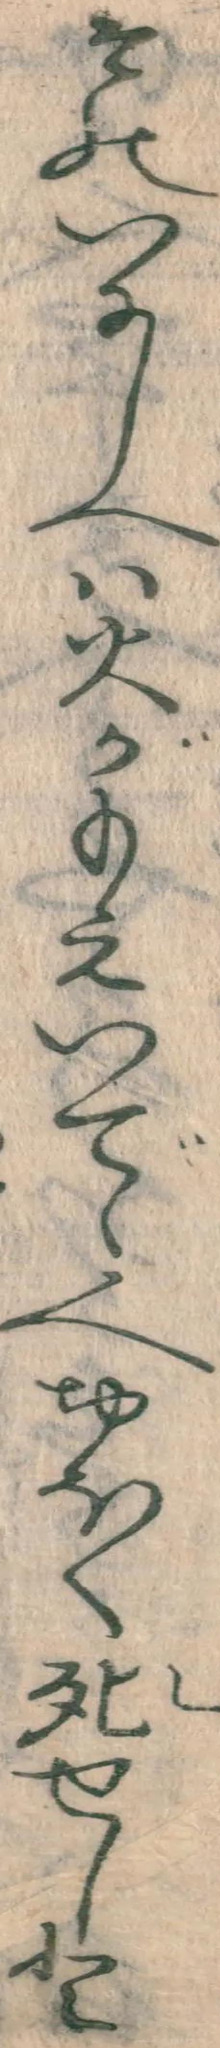そのいにしへは火がもえいでゝ人おほく死せしと
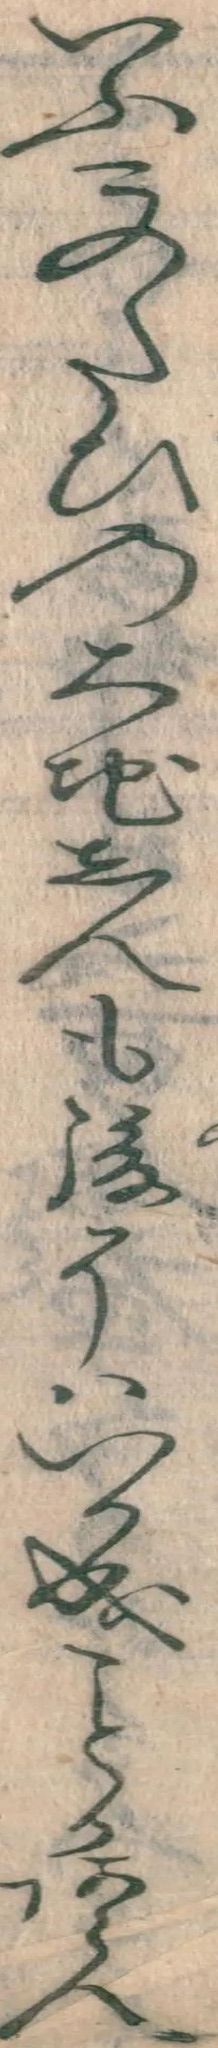いふこのたびのだい大地震も後にはいか成ことかあらん
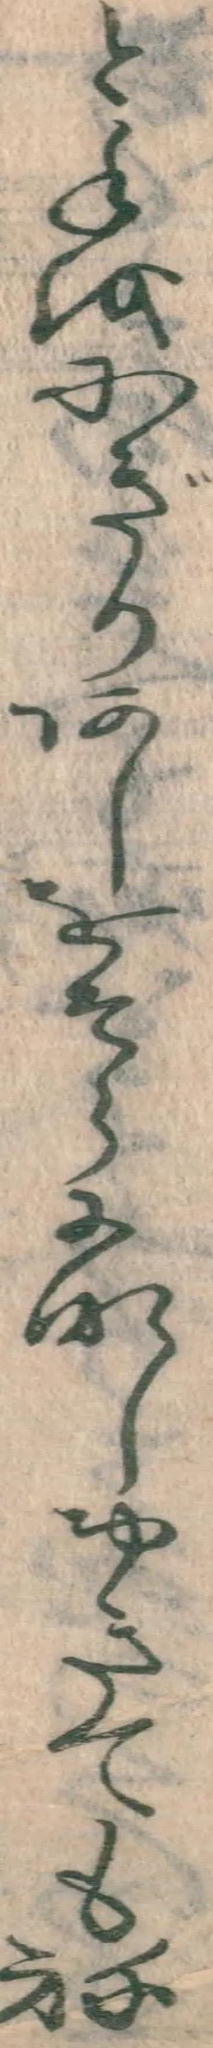と手をにぎりあしをそらになしおきてもね
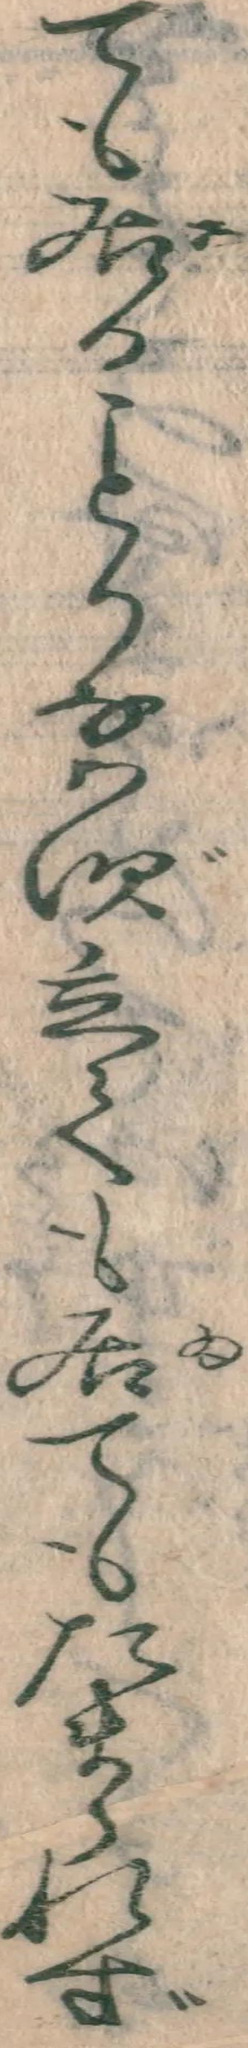ても居ることかなはず立ても居てもたまられず
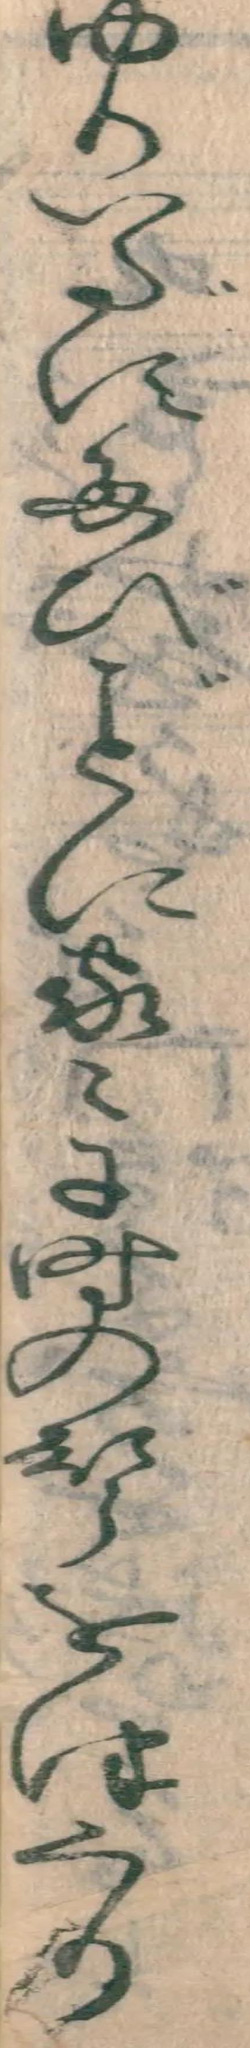ゆりいだすたびごとに家々に時の聲をつくり
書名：艱難目異志. 上,下
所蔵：国立国会図書館 National Diet Library, JAPAN
